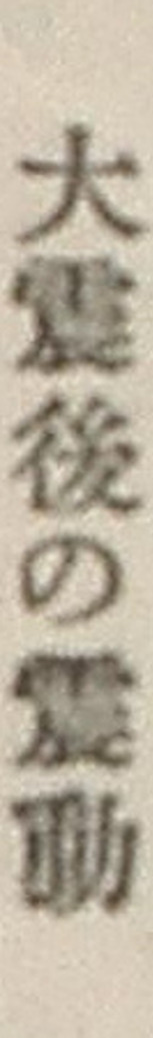大震後の震動
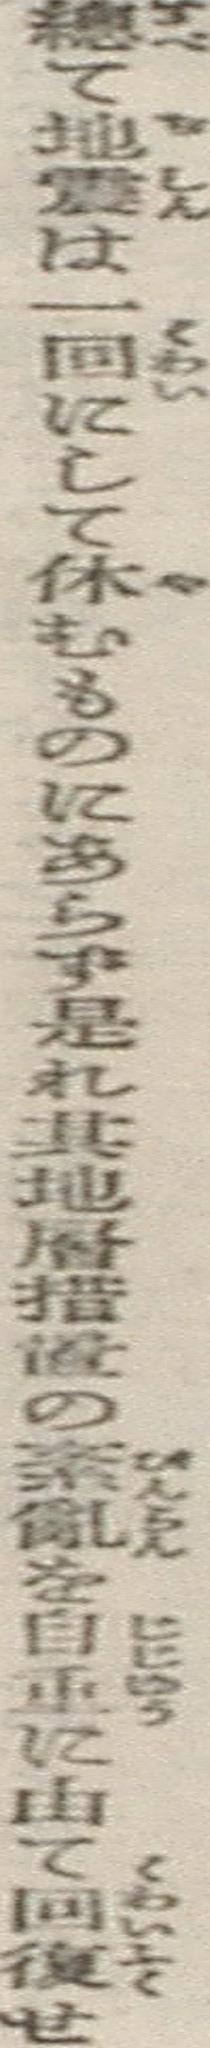総て地震は一回にして休むものにあらず是れ其の地層措置の紊乱を自重に由て回復せ
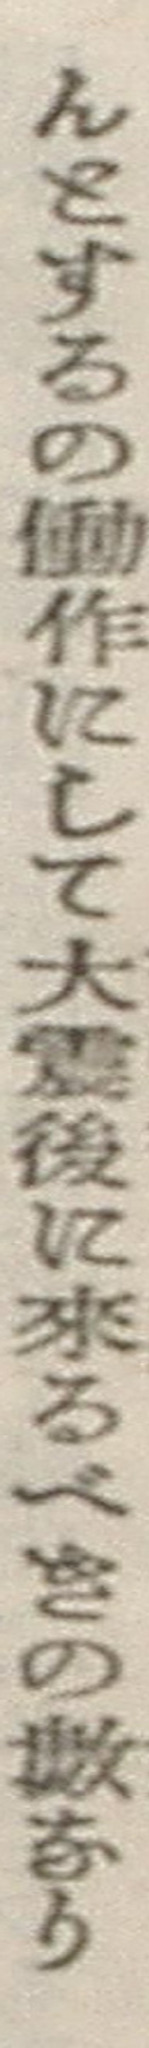んとするの働作にして大震後に来るべきの数なり
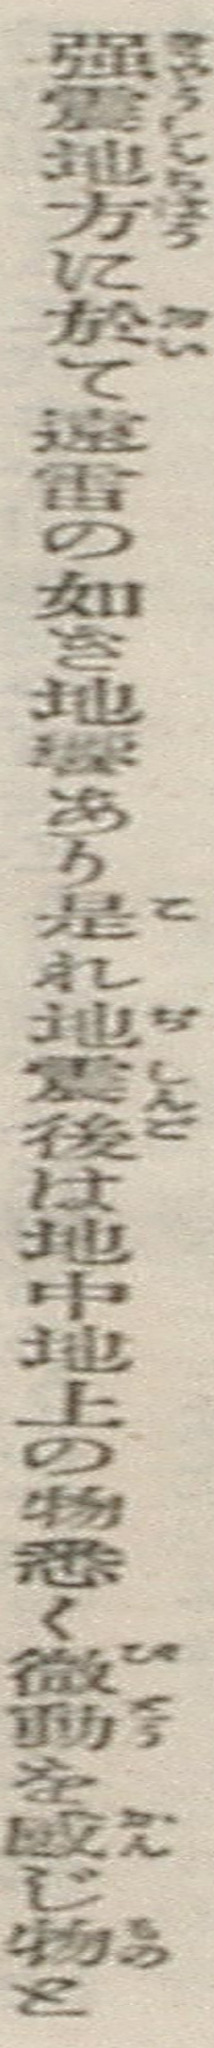強震地方に於て遠雷の如き地響あり是れ地震後は地中地上の物悉く微動を感じ物と
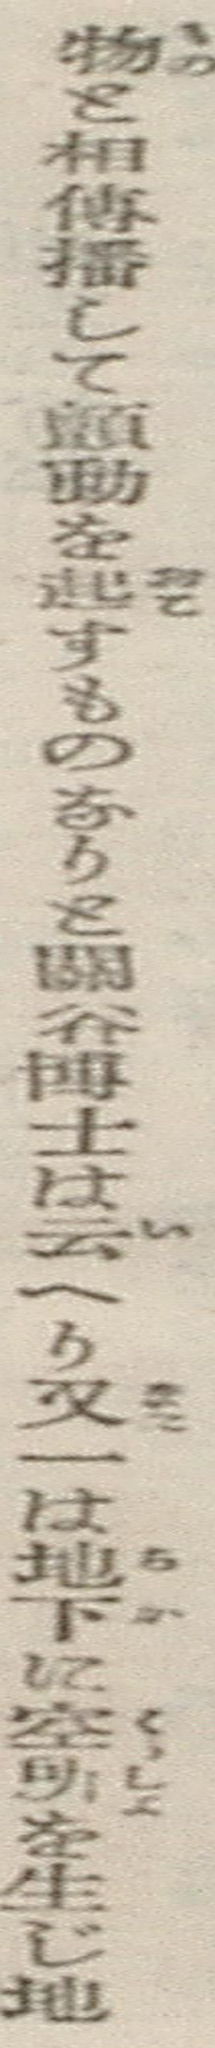物と相伝播して顛動を起すものなりと関谷博士は云へり又一は地下に空所を生じ地
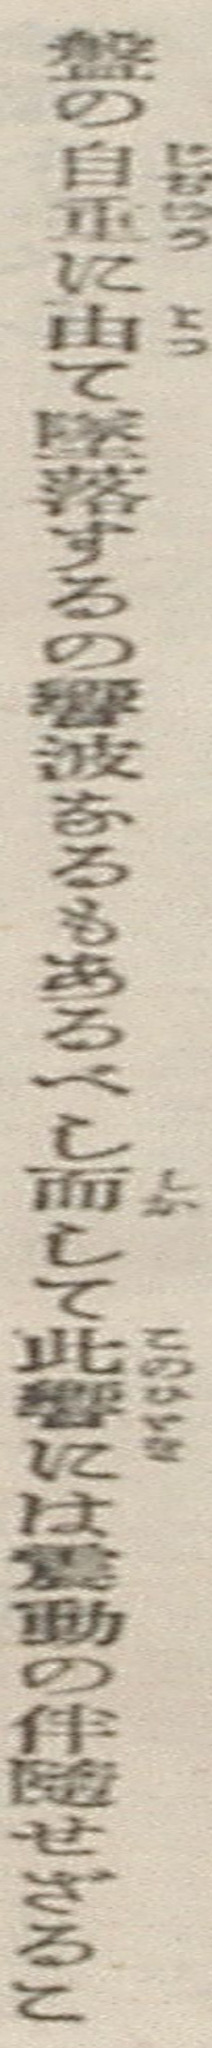盤の自重に由て墜落するの響波なるもあるべし而して此響には震動の伴随せざるこ
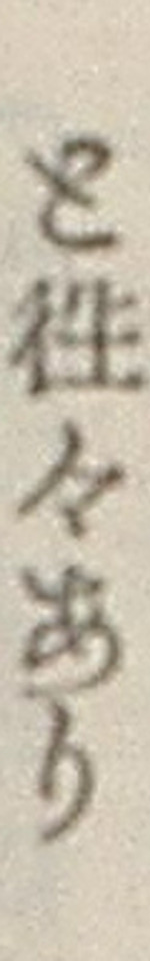と往々あり
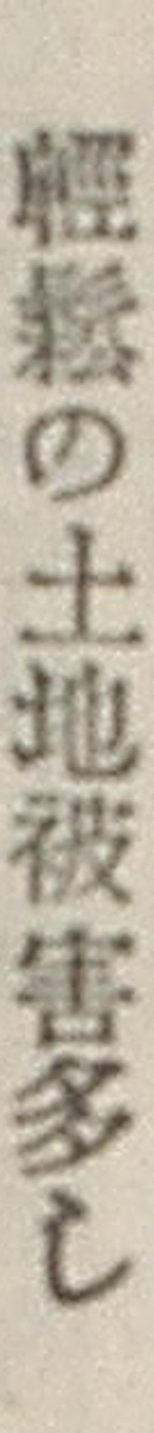軽鬆の土地被害多し
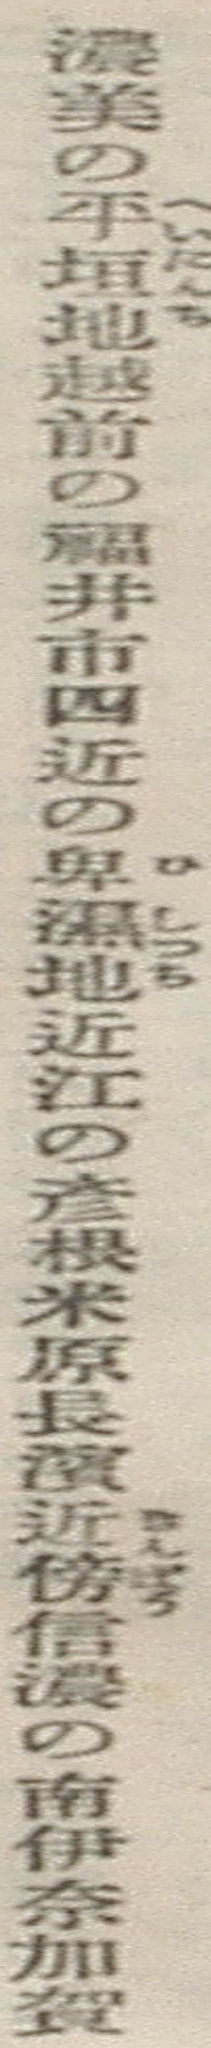濃美の平坦地越前の福井市四近の卑湿地近江の彦根米原長浜近傍信濃の南伊奈加賀
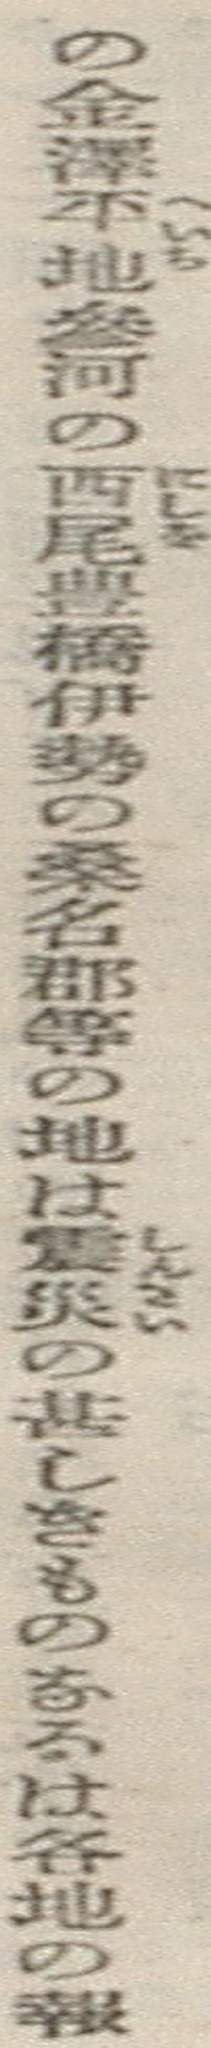の金沢平地参河の西尾豊橋伊勢の桑名郡等の地は震災の甚しきものなるは各地の報
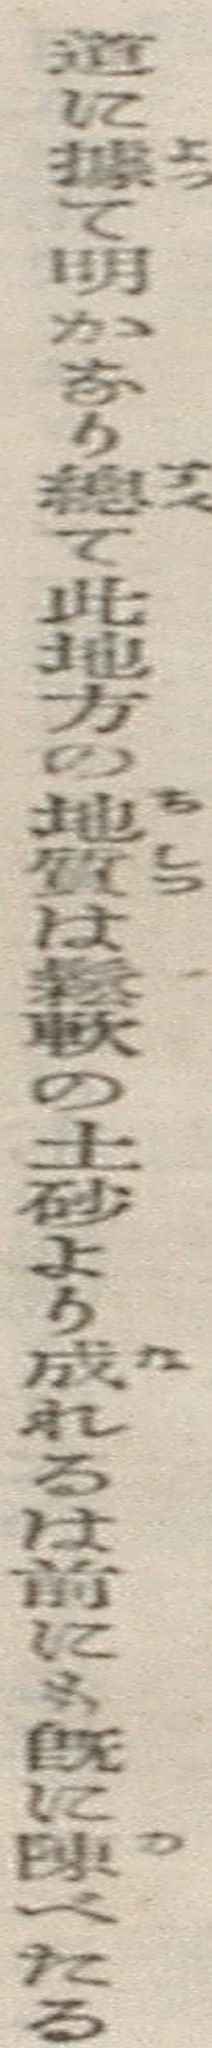道に據て明かなり総て此地方の地質は鬆軟の土砂より成れるは前にも既に陳べたる
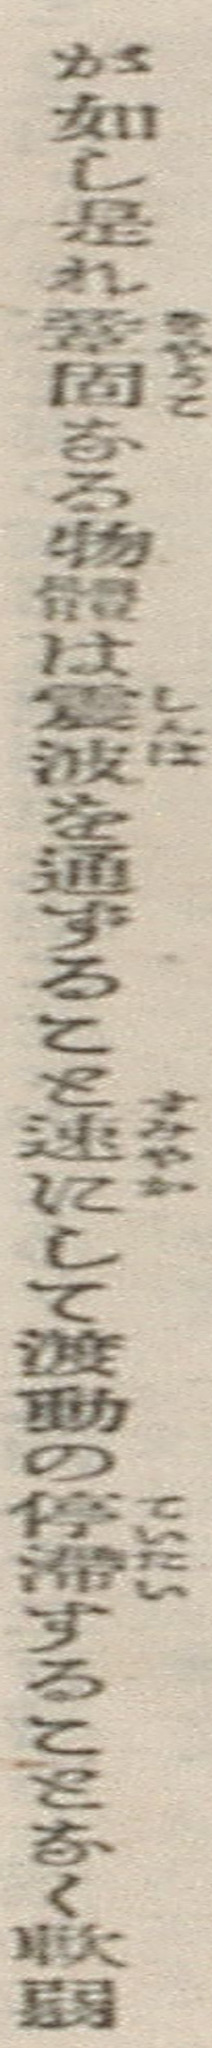が如し是れ鞏固なる物体は震波を通ずること速にして渡動の停滞することなく軟弱
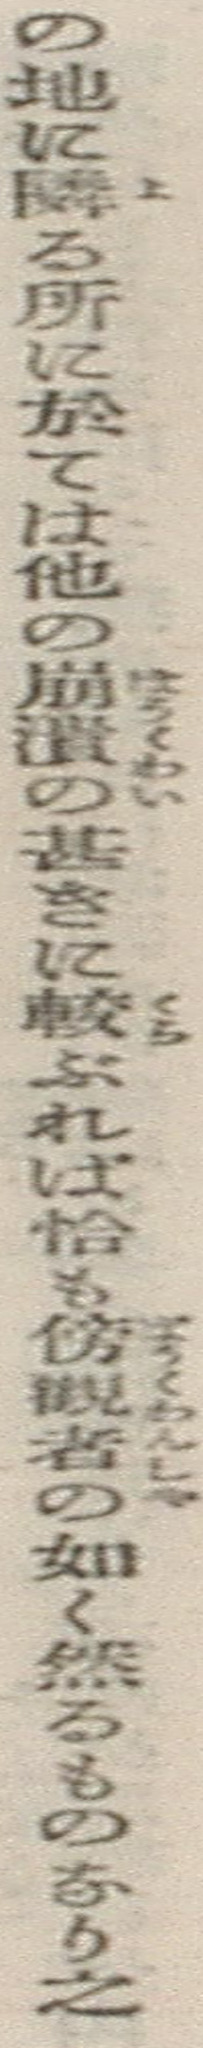の地に隣る所に於ては他の崩潰の甚きに較ぶれば恰も傍観者の如く然るものなり之
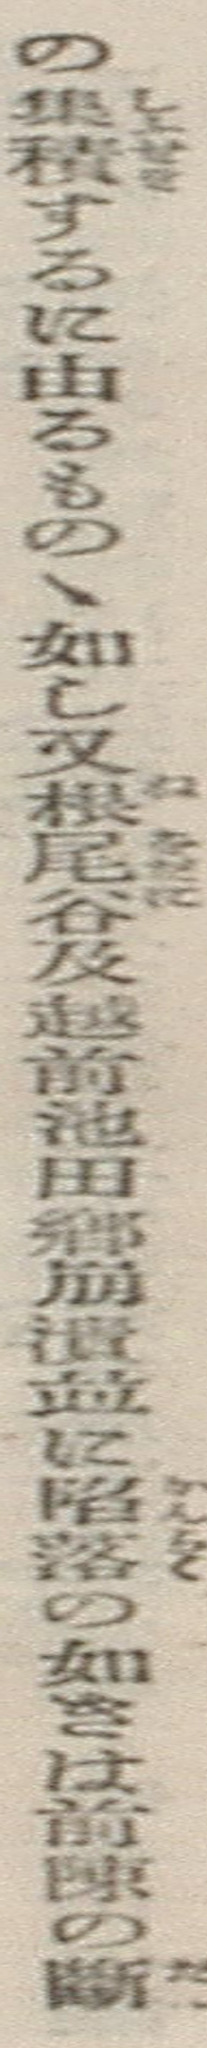の集積するに由るものゝ如し又根尾谷越前池田郷崩潰竝に陥落の如きは前陳の断
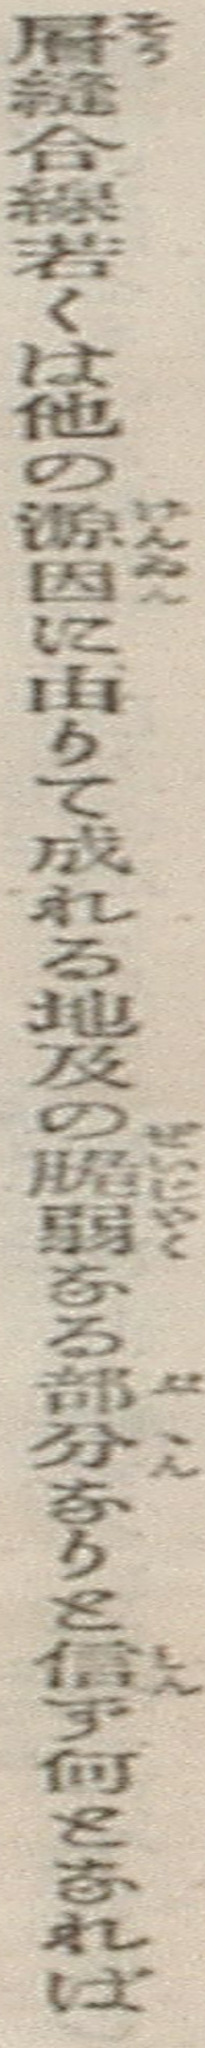層縫合線若くは他の源因に由りて成れる地及の脆弱なる部分なりと信ず何となれば
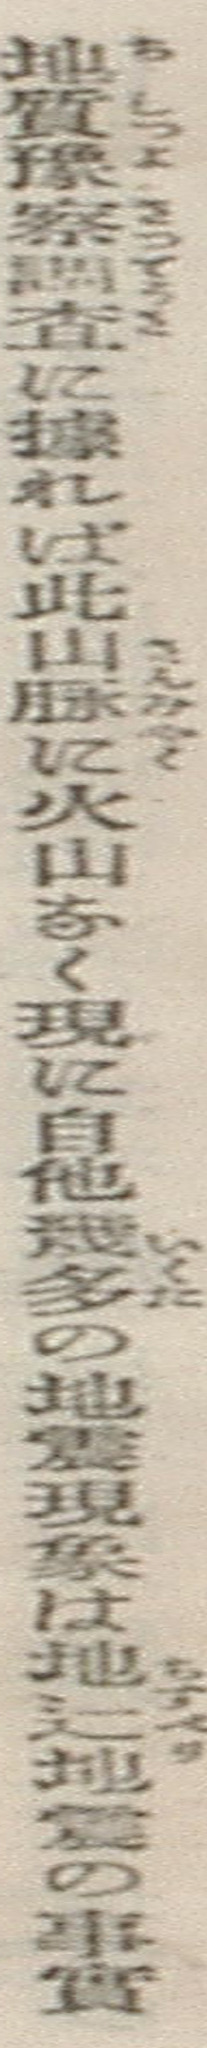地質予察調査に據れば此山脈に火山なく現に自他幾多の地震現象は地辷地震の事実
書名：愛知岐阜福井三県　大地震見聞録（内題）
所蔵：東京大学地震研究所図書室 Earthquake Research Institute Library, The University of Tokyo, JAPAN
